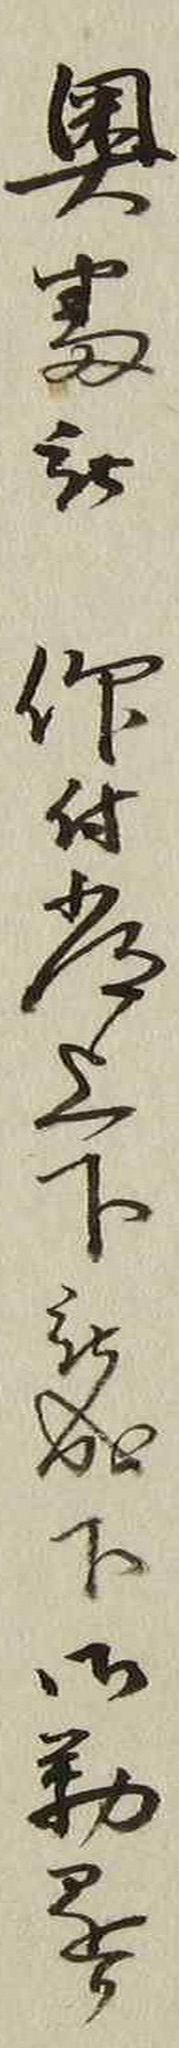奥番被仰付常上下被成下御勤懸り
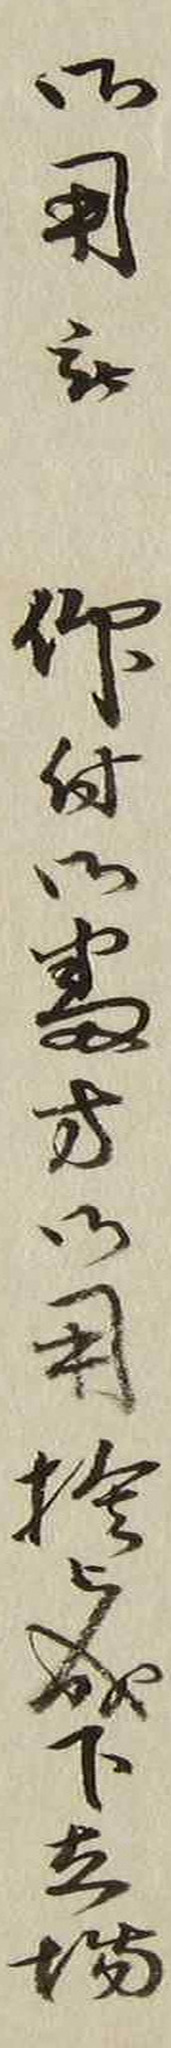御用被仰付御番方御用捨被成下立場
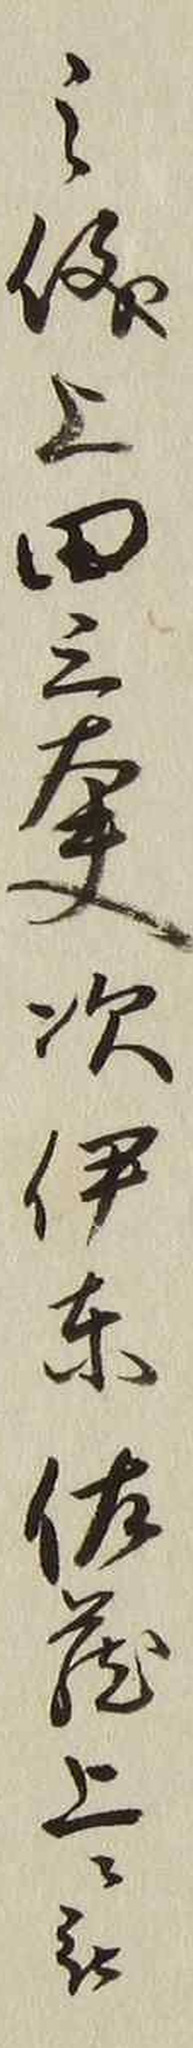之儀上田三太夫次伊東佐蔵上ニ被
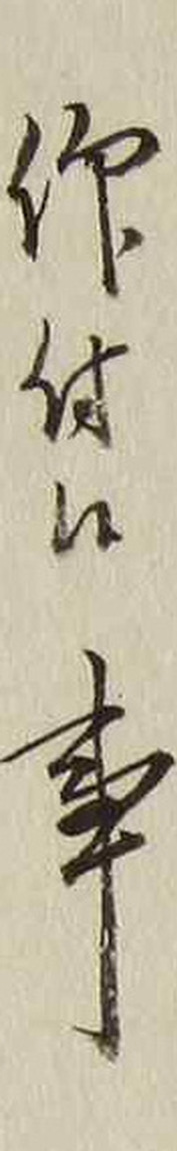仰付候事
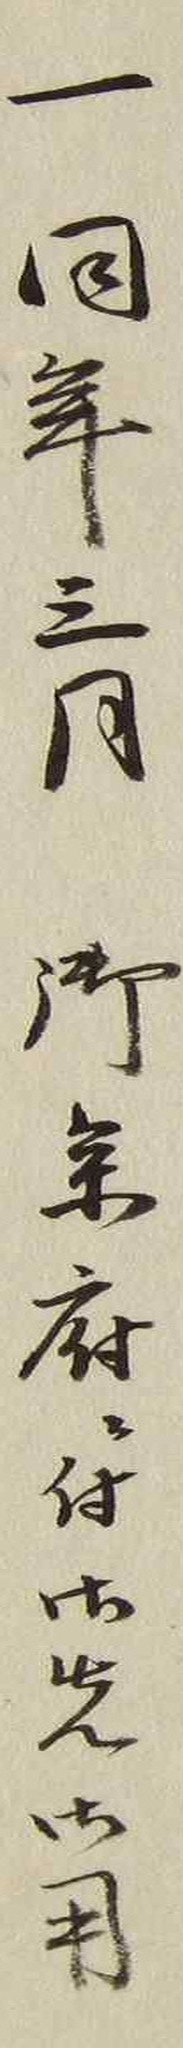一同年三月御参府ニ付御先御用
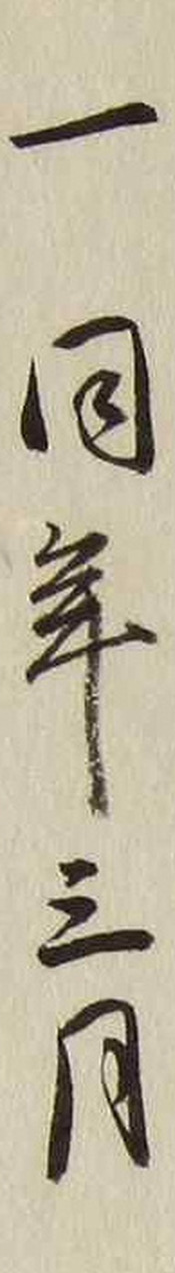一同年十月
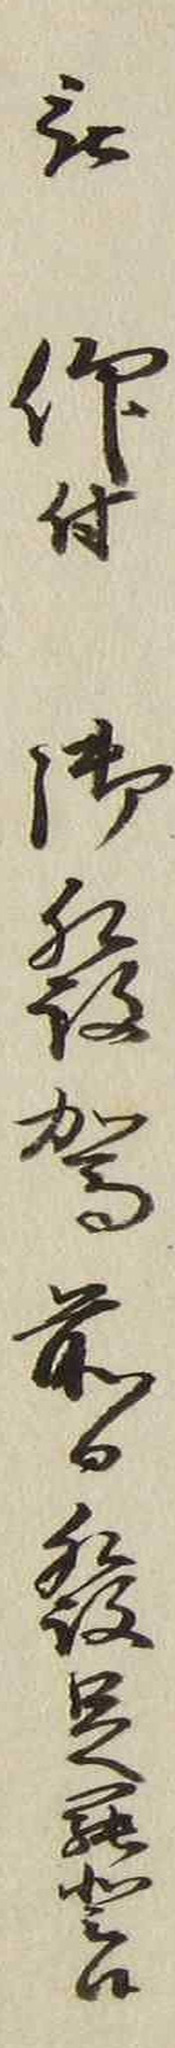被仰付御発駕前日発足罷登候

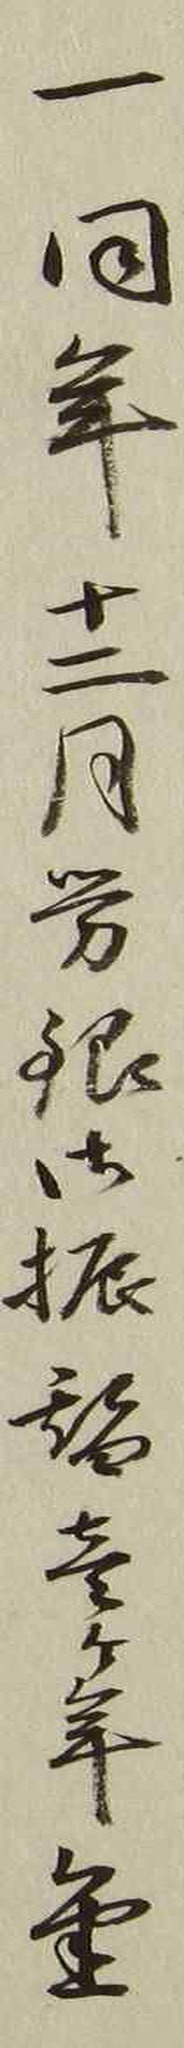一同年十二月労銀御振替壱ケ年金
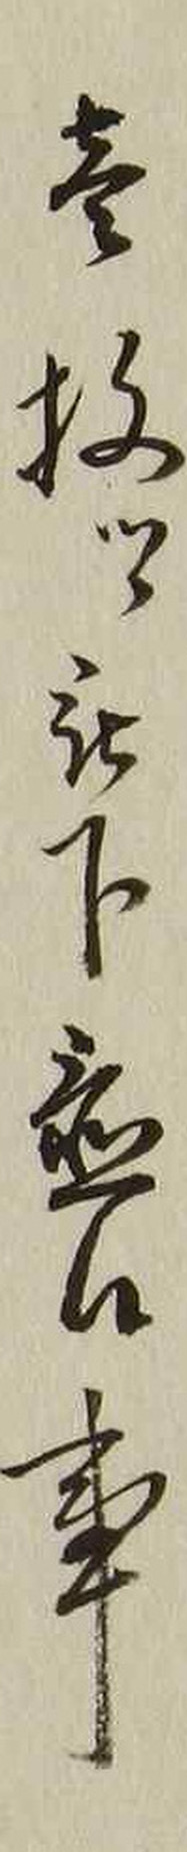壱枚ツヽ被下置候事
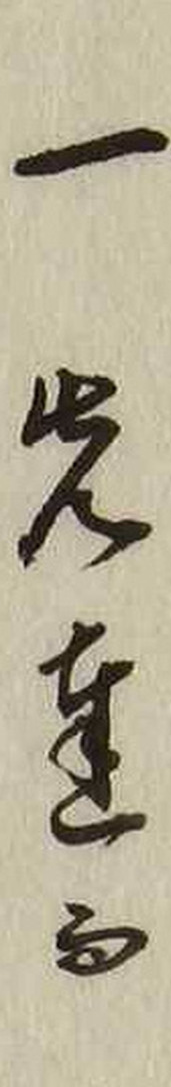一先達而
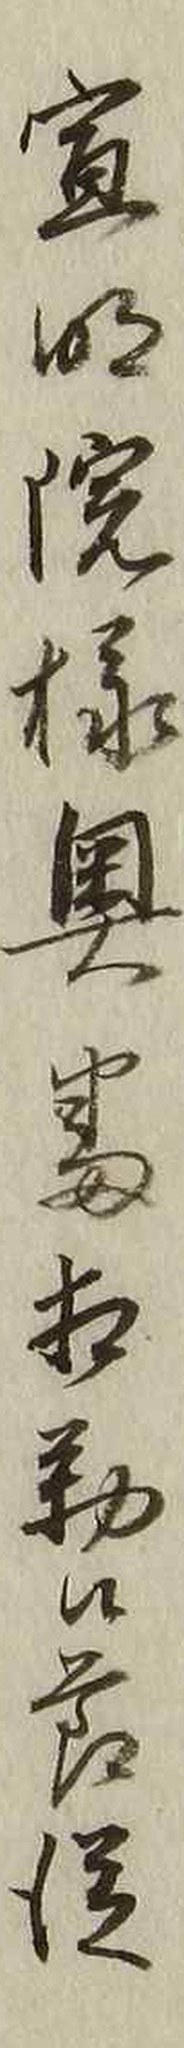宣明院様奥番相勤候節従
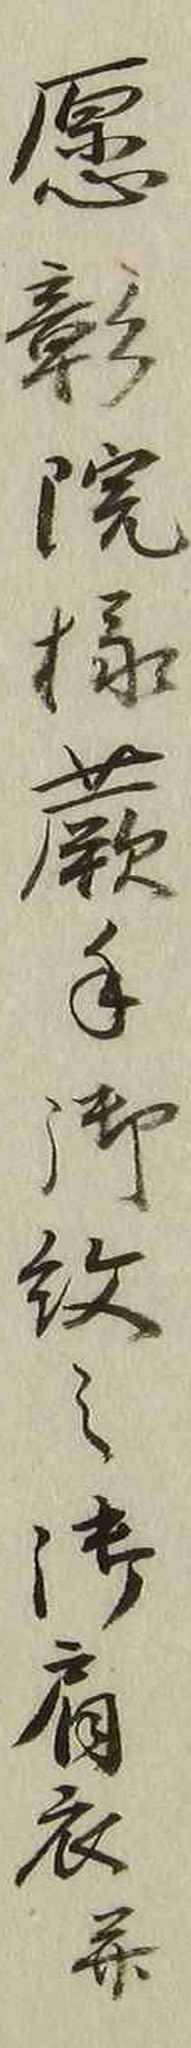愿彰院様蕨手御紋之御肩衣并
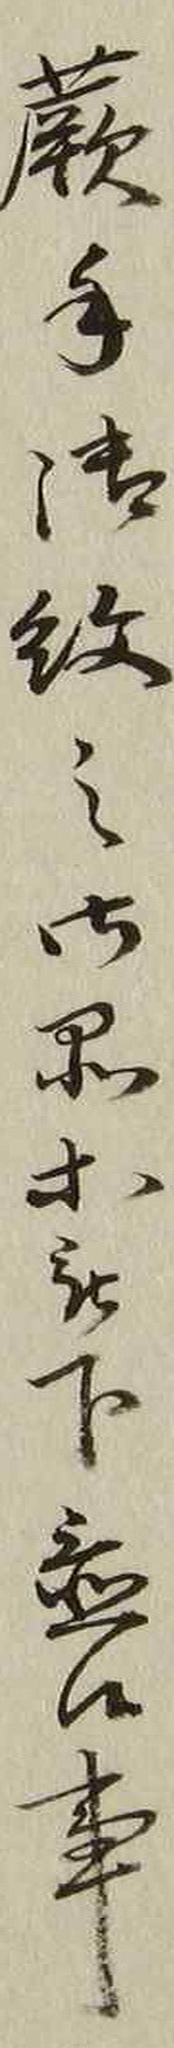蕨手御紋之御品等被下置候事
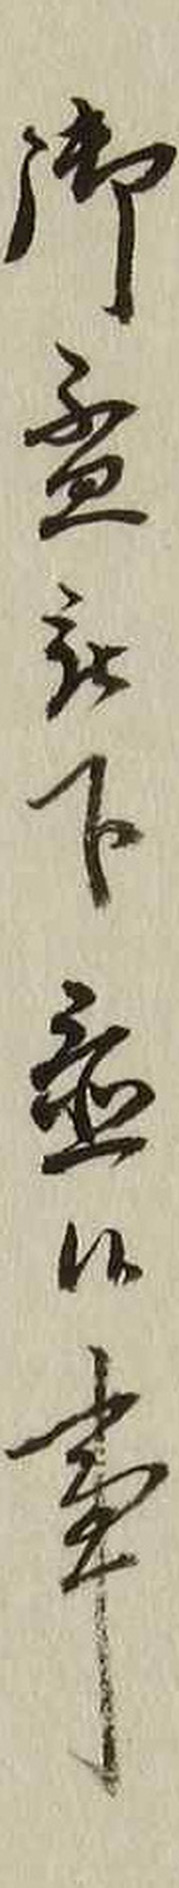御盃被下置候事
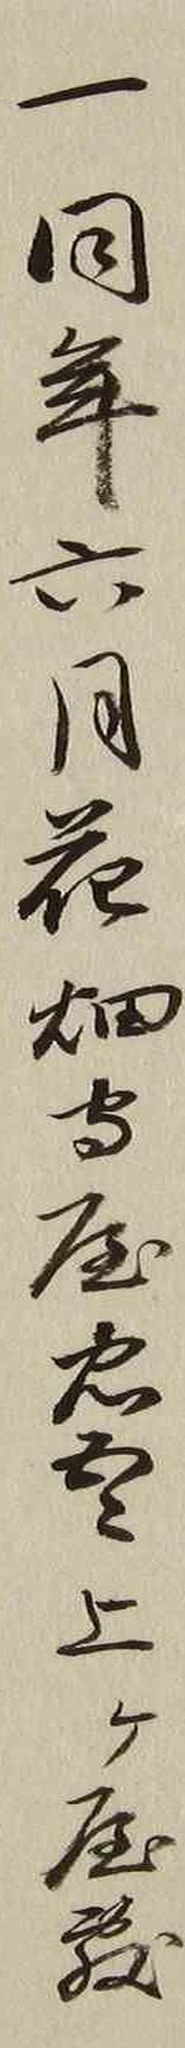一同年六月花畑守屋忠吾上ケ屋敷
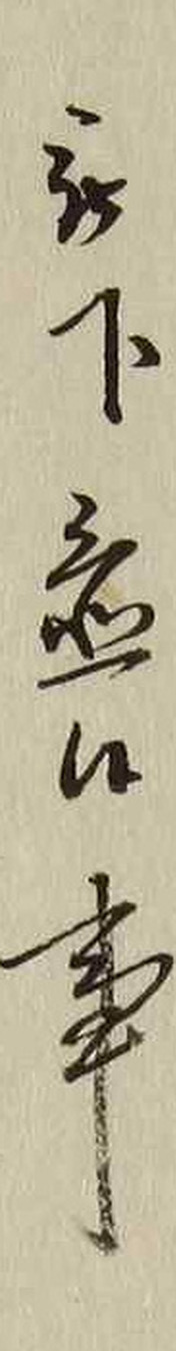被下置候事
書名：諸士系譜　巻之160　な之部2
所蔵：会津若松市立会津図書館
